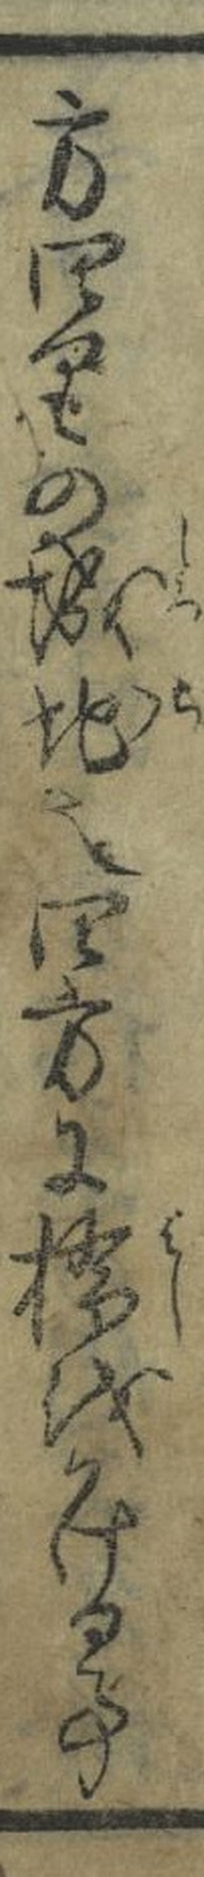方四里の城地也四方に橋をかける事
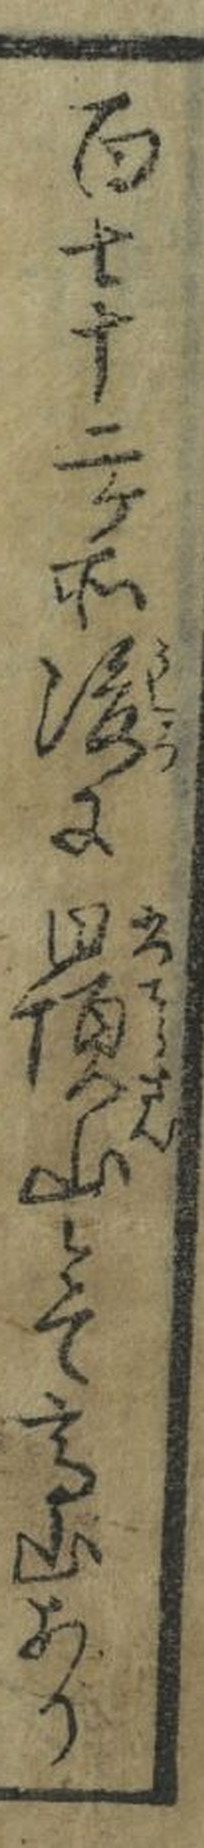百七十二ヶ所後に日頂山とて高山あり
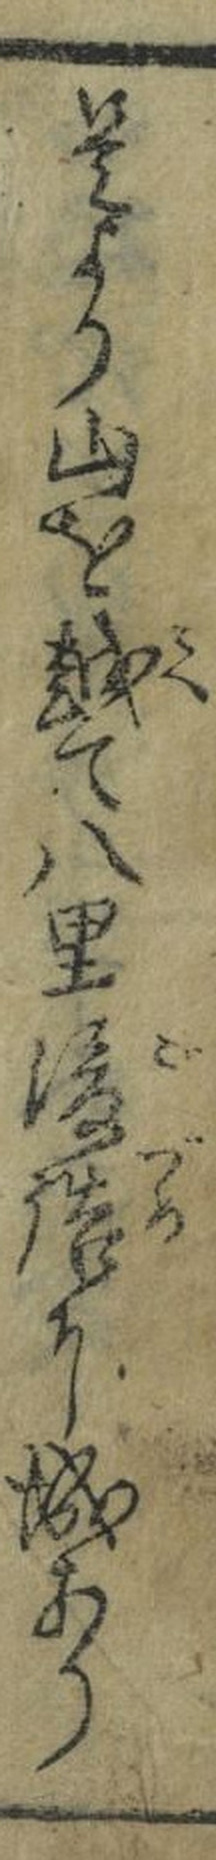是より山を越て八里後詰に城あり
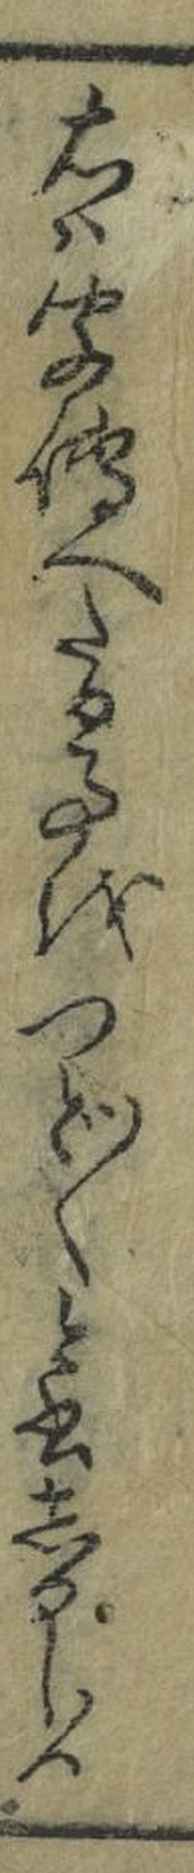右は聞伝へたる事をつど〳〵と書しるしいつ
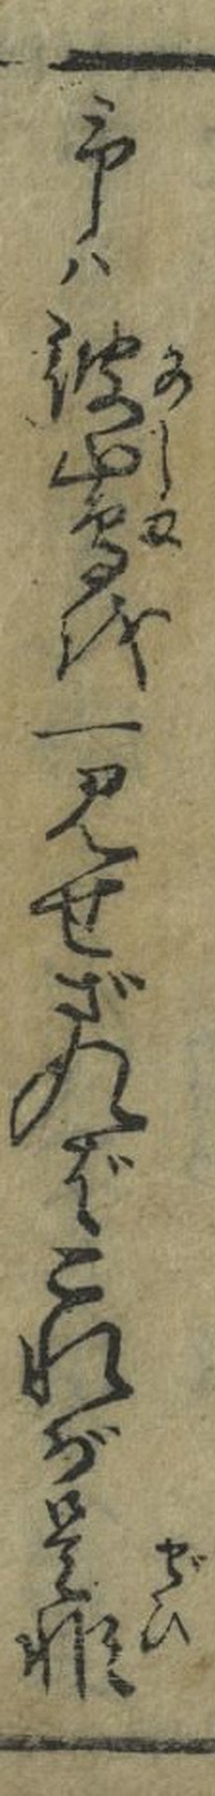ては彼島を一見せざればこれが是非
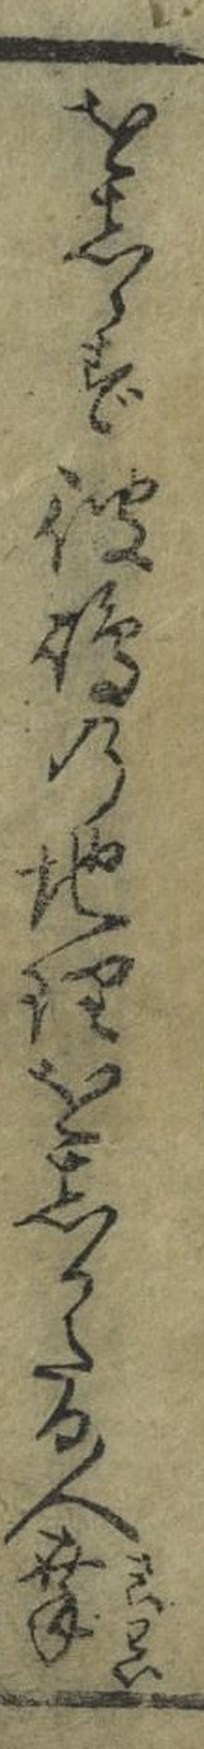をしらず彼島の地理をしりたる人幸
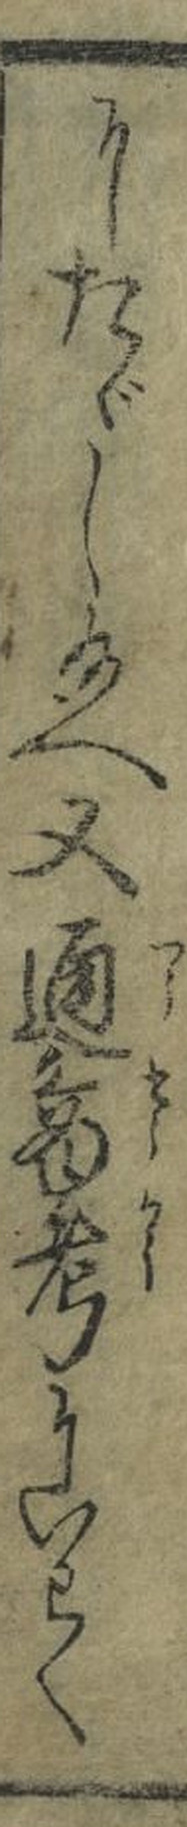にたゞし給へ又通商考にいわく

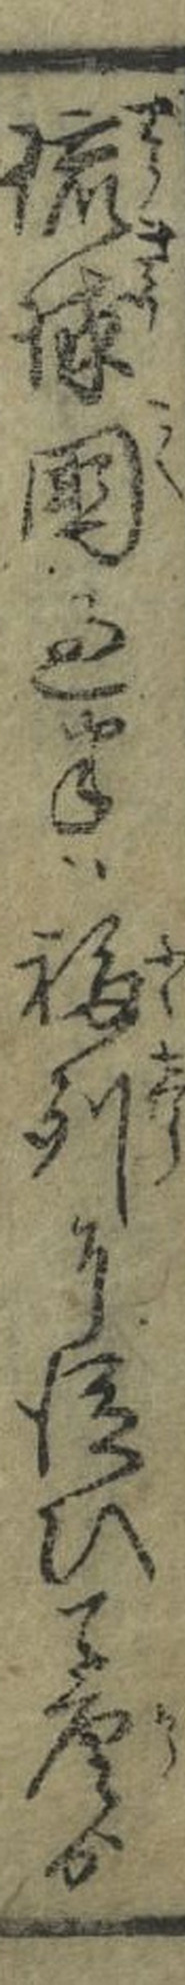琉球国過半は福州に従ひて唐ゟ
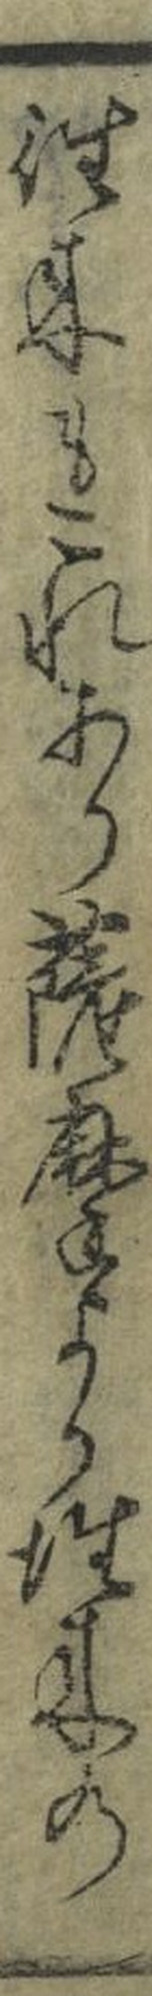往来もこれあり薩摩より往来の
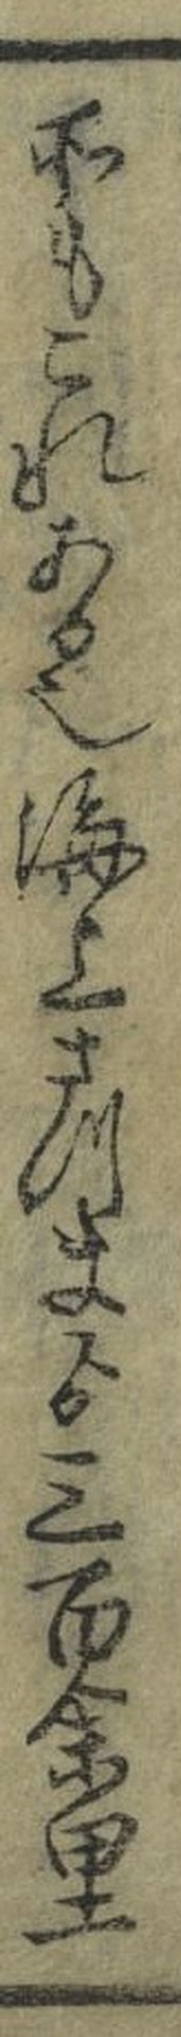所もこれある也海上さつまゟ三百余里
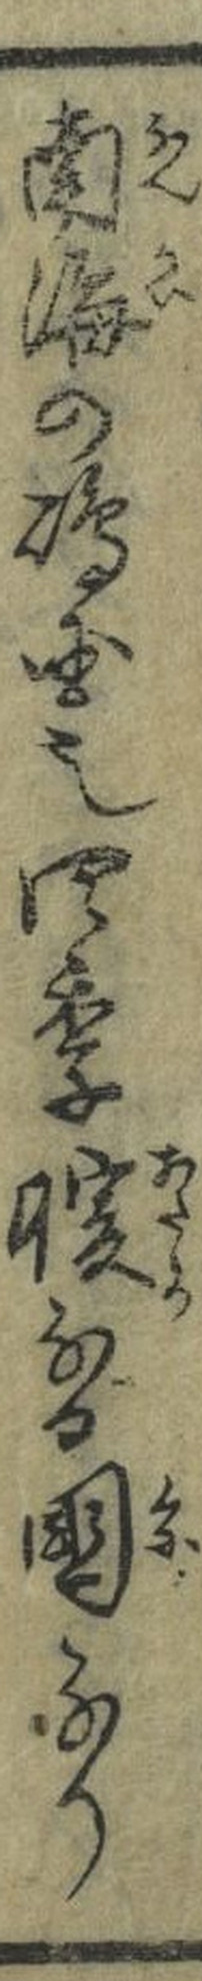南海の島国也四季暖なる国なり
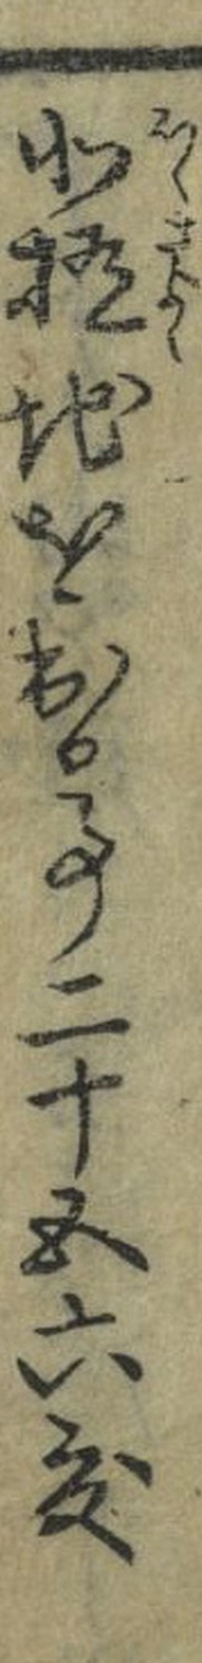北極地を出る事二十五六度
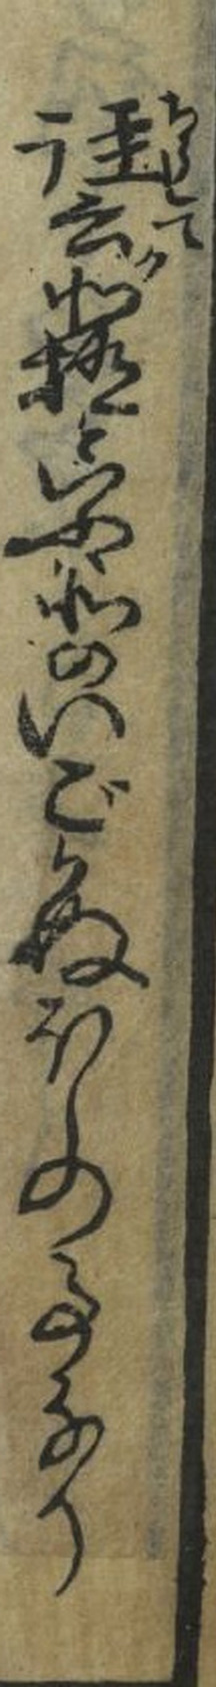註云く北極といふは北のいごかぬほしの事なり
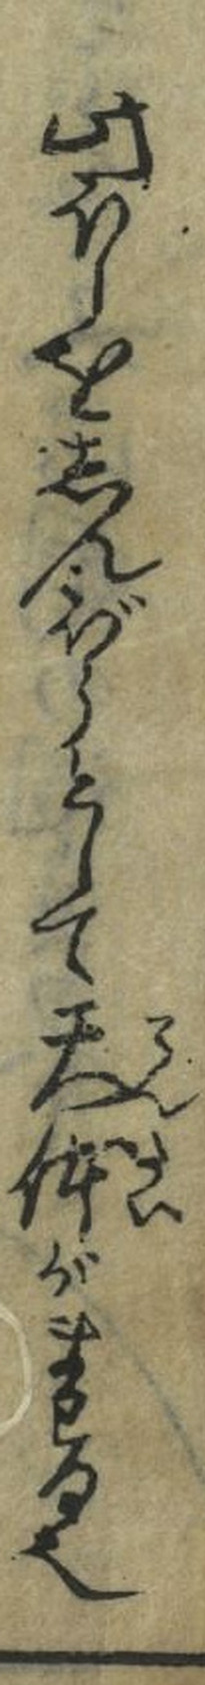此ほしをしんぼうとして天体がまわる也
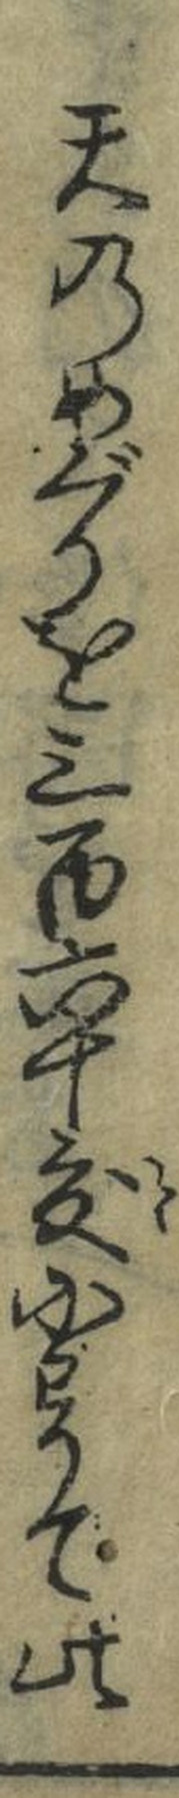天のめぐりを三百六十度にわりて此
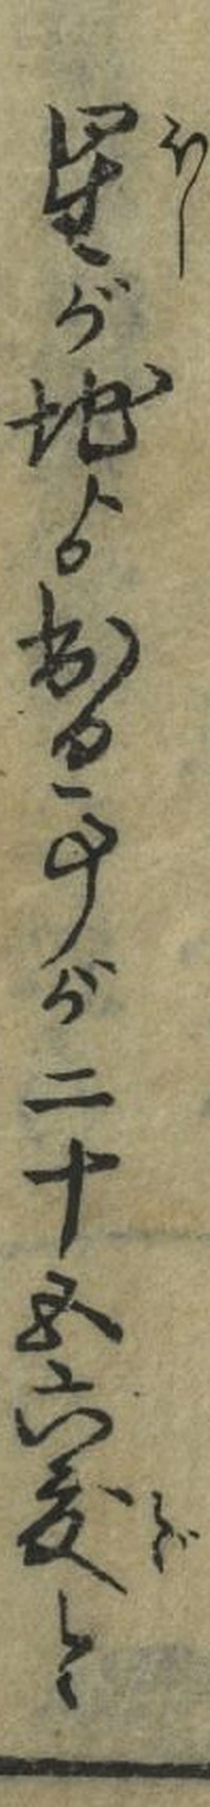星が地ゟ出る事が二十五六度と
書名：琉球雑話
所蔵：University of the Ryukyus Library
